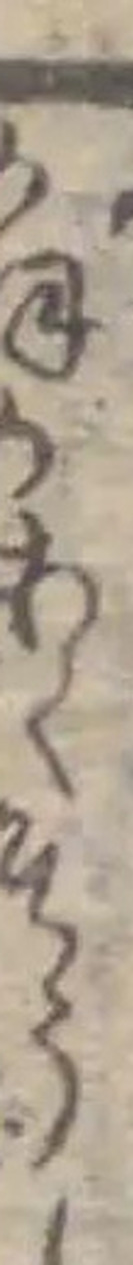かほがあくそうで
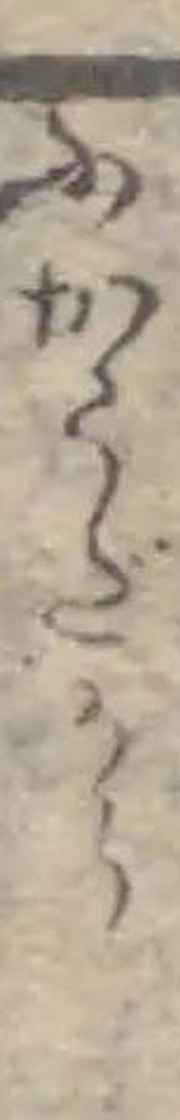ふかうだから
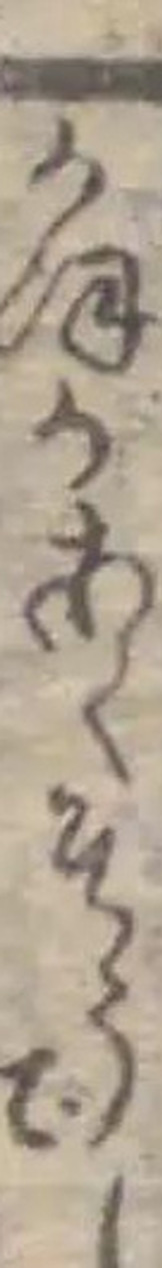かほがあくそうで
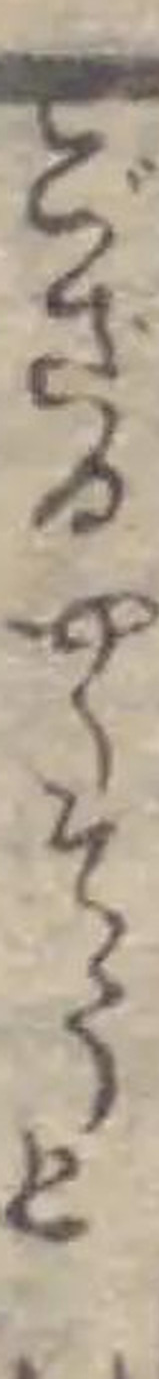ござるやくそうと
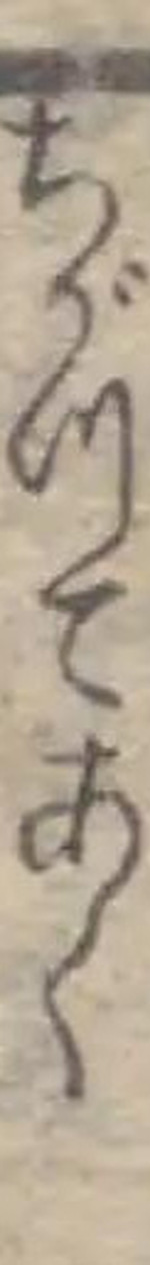ちがつてあく
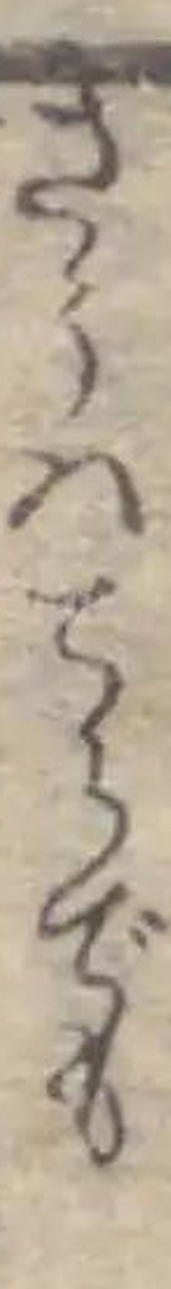さうはてらでも
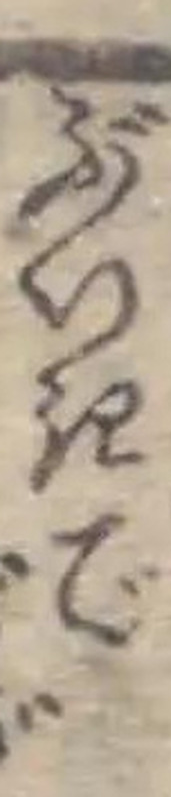ぶいきで
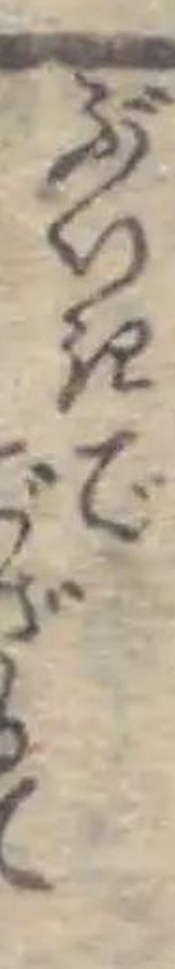ぶいきで
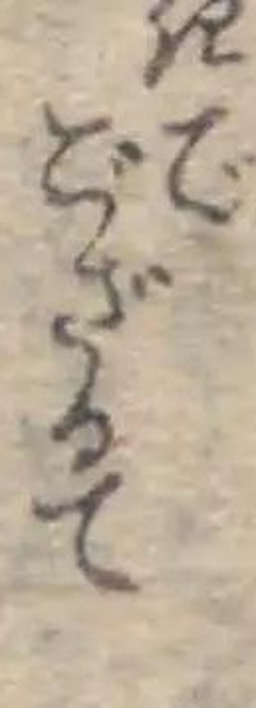ござるて
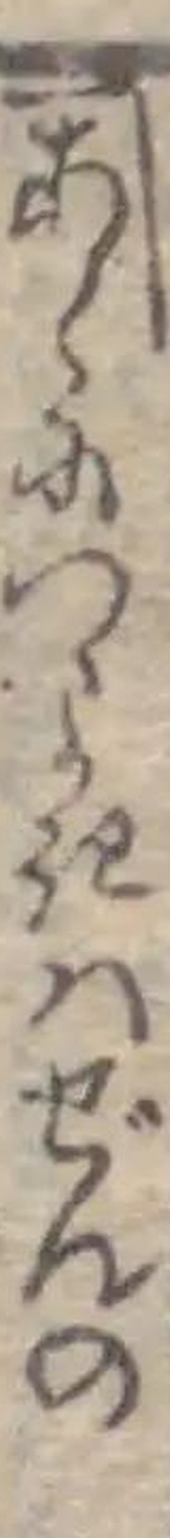〽あくにつよきはぜんの
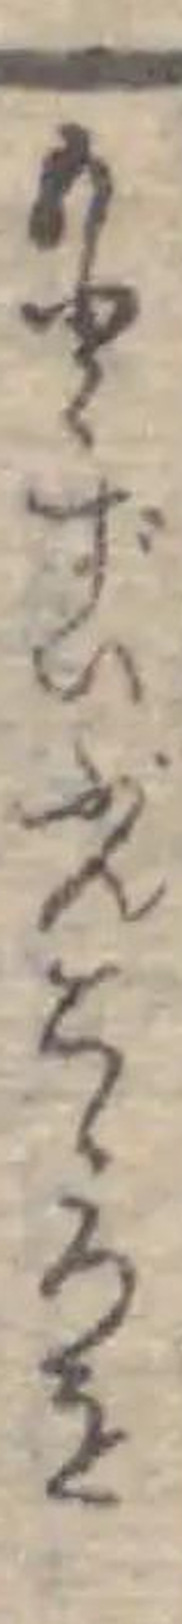もとずいぶんこゝろを
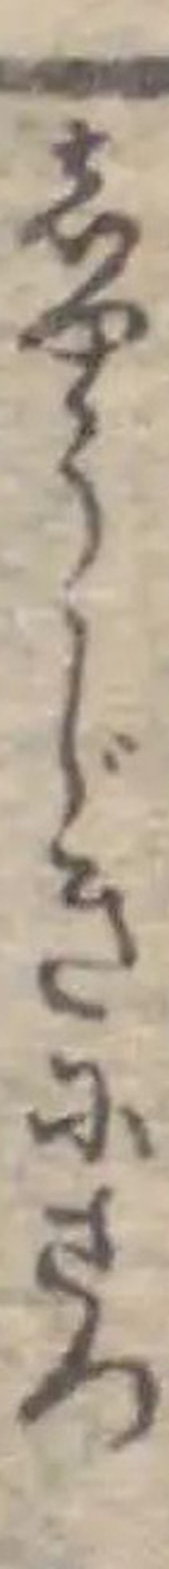しやうじきにさつ
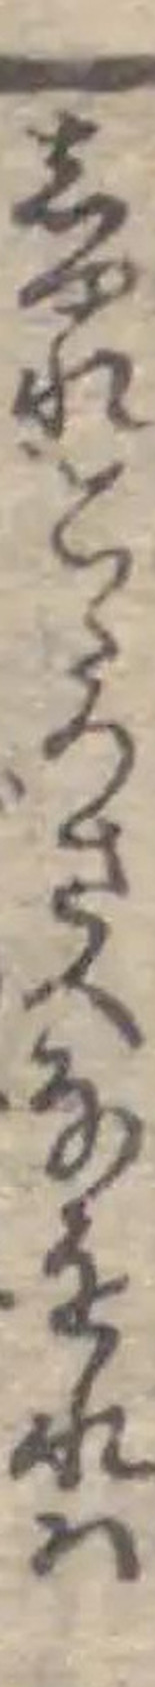しやれこゝろさへなをれば
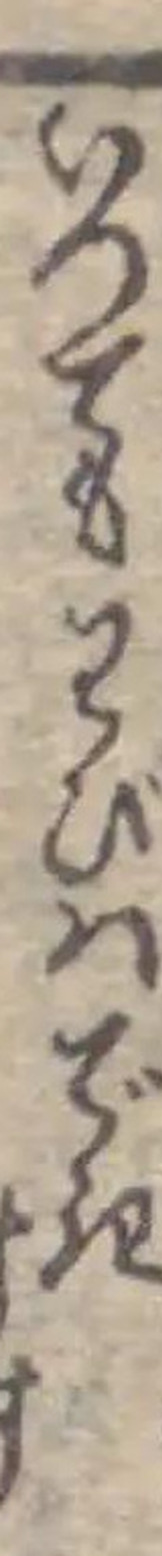いつてもわびはでき

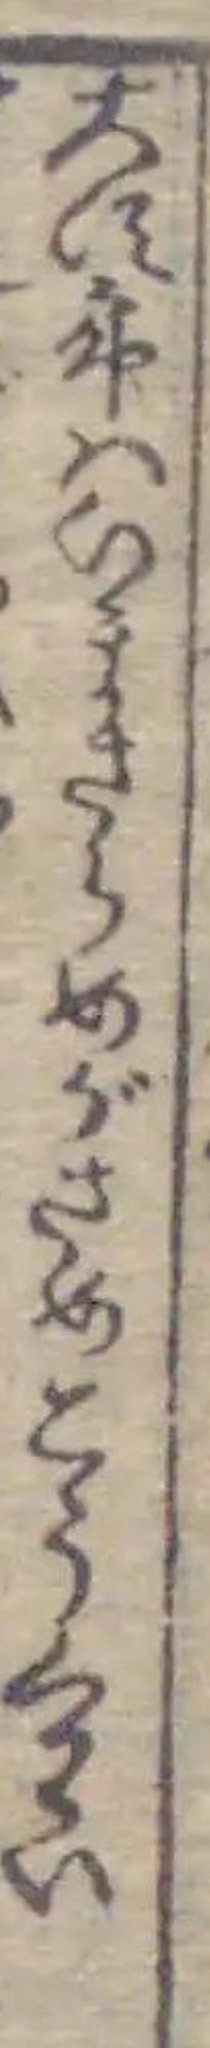大治郎はいまさらめがさめこうくわい
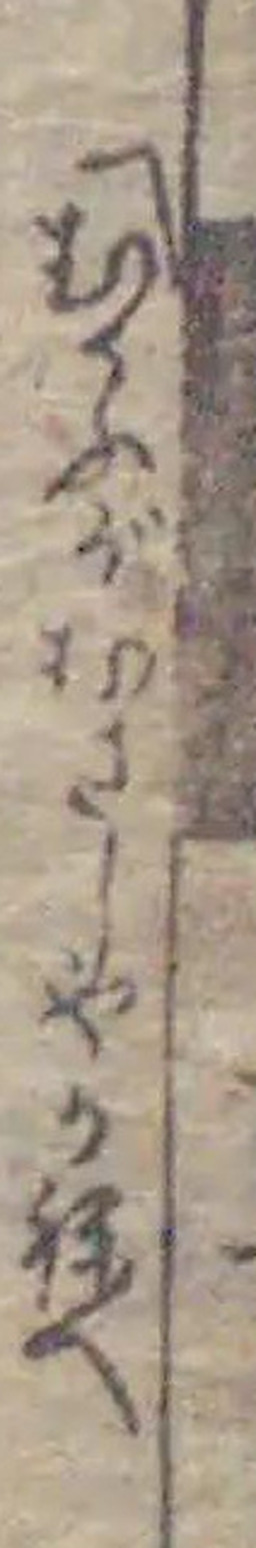〽むかふがむさしやかねへ
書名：福壽海旡量品玉 3巻
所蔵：国立国会図書館 National Diet Library, JAPAN
